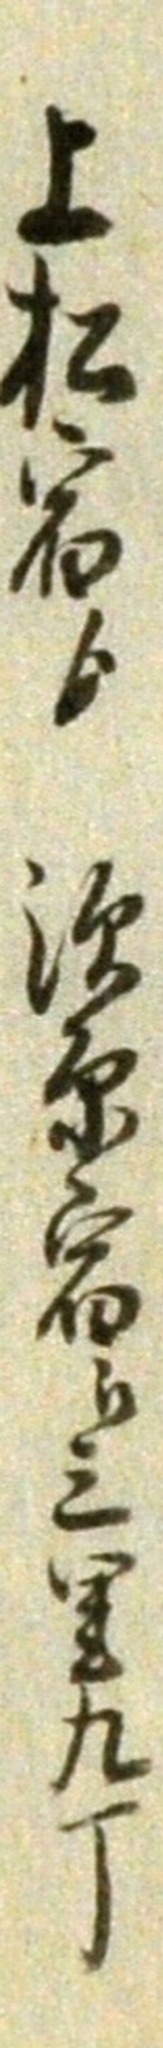上松宿ゟ須原宿江三里九丁
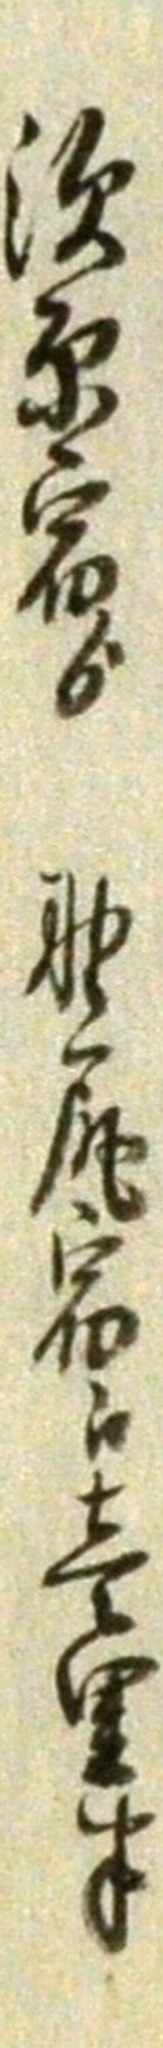須原宿ゟ野尻宿江壱里半
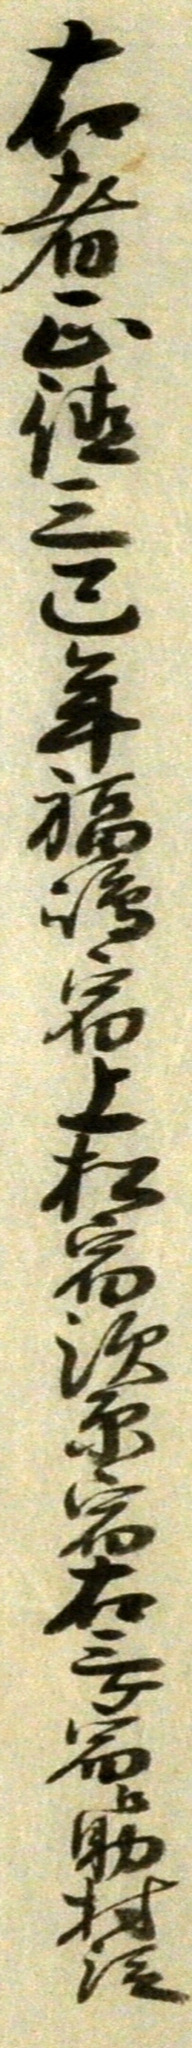右者正徳三巳年福嶋宿上松宿須原宿右三ヶ宿江助村従
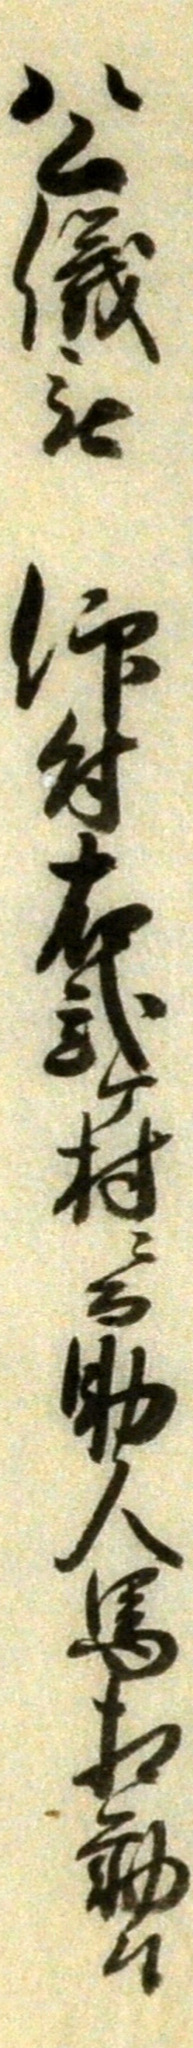公儀被仰付右弐ヶ村ニ而助人馬相勤候
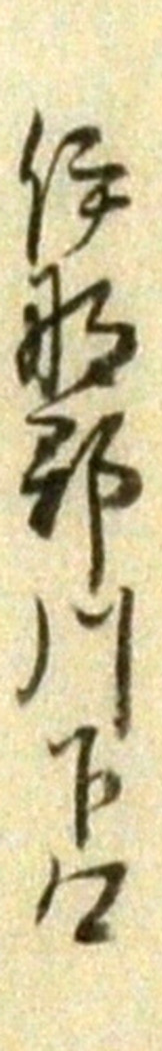伊那郡川下郷
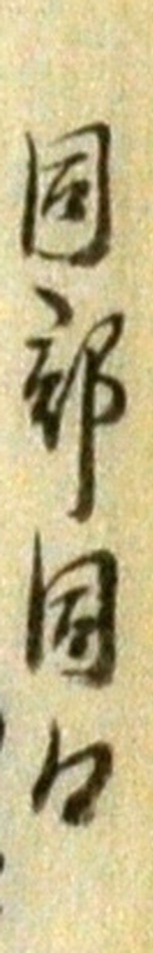同郡同郷
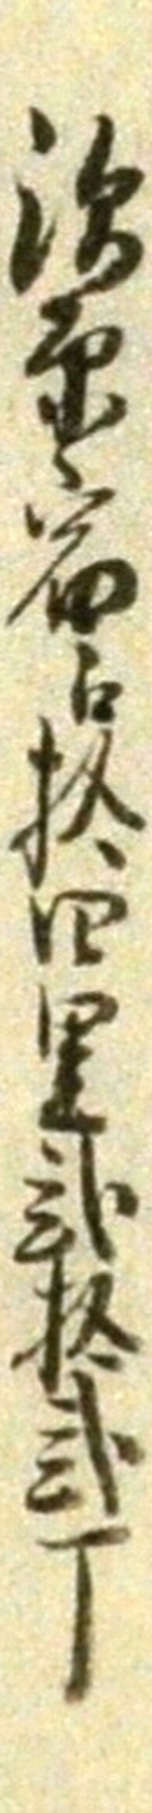同村ゟ須原宿江拾四里弐拾弐丁
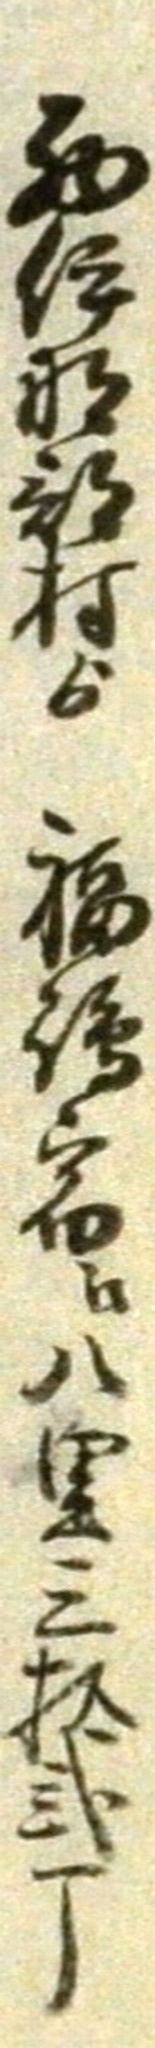西伊那部村ゟ福嶋宿江八里三拾弐丁
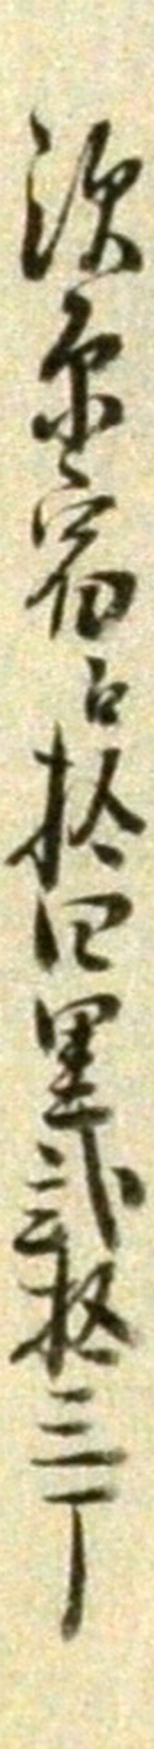同村ゟ須原宿江拾四里弐拾三丁

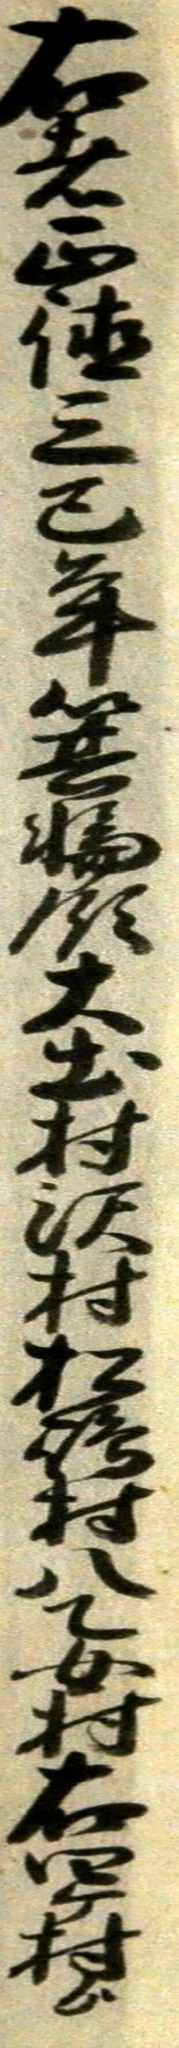右者正徳三巳年箕輪領大出村沢村松嶋村八乙女村右四ヶ村ゟ
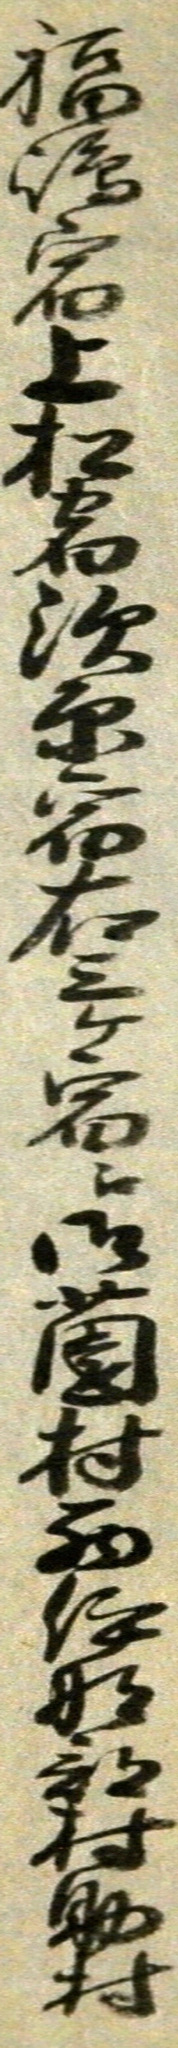福嶋宿上松宿須原宿右三ヶ宿江御薗村西伊那部村助村
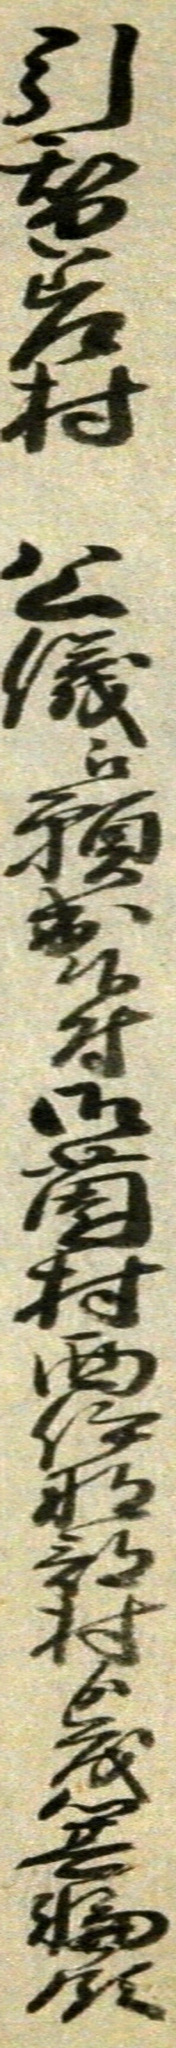引替差村公儀江願出候付御薗村西伊那部村ゟ茂箕輪領
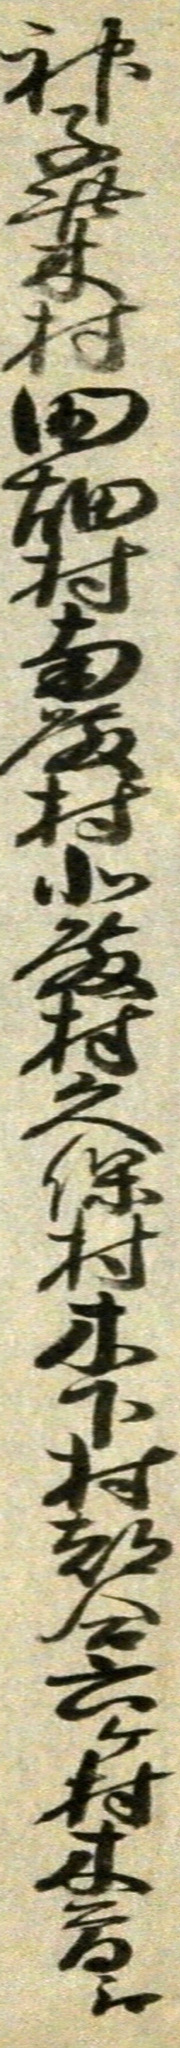神子柴村田畑村南殿村北殿村久保村木下村都合六ヶ村木曽江
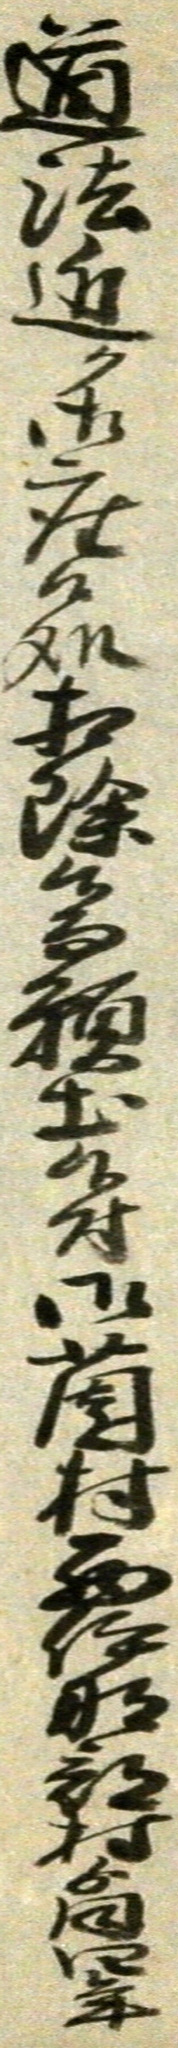道法近ク御座候所相除候而願出候付御薗村西伊那部村ゟ同四年
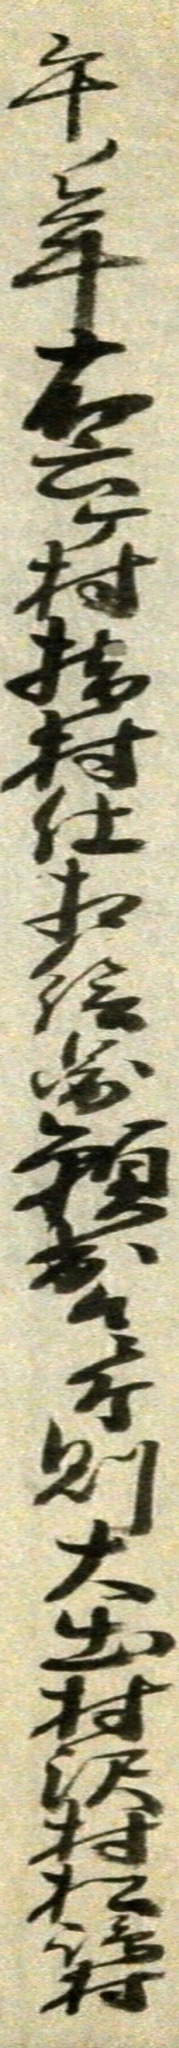午ノ年右六ヶ村指村仕相絵図願出候ニ付則大出村沢村松嶋村
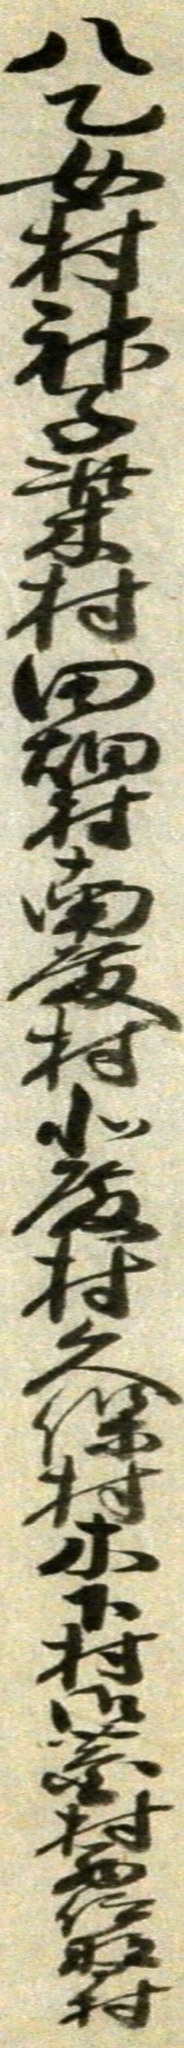八乙女村神子柴村田畑村南殿村北殿村久保村木下村御薗村西稲村
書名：御領分拾九箇村木曽助并塩尻町・洗馬町・本山町へ人馬勤覚帳
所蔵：伊那市立高遠町図書館・合同会社AMANE
